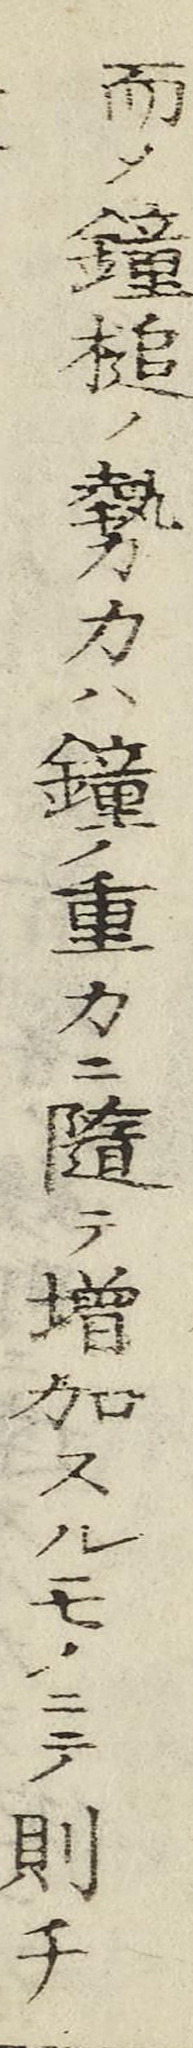而シテ鐘槌ノ勢力ハ鐘ノ重力ニ随テ増加スルモノニテ則チ
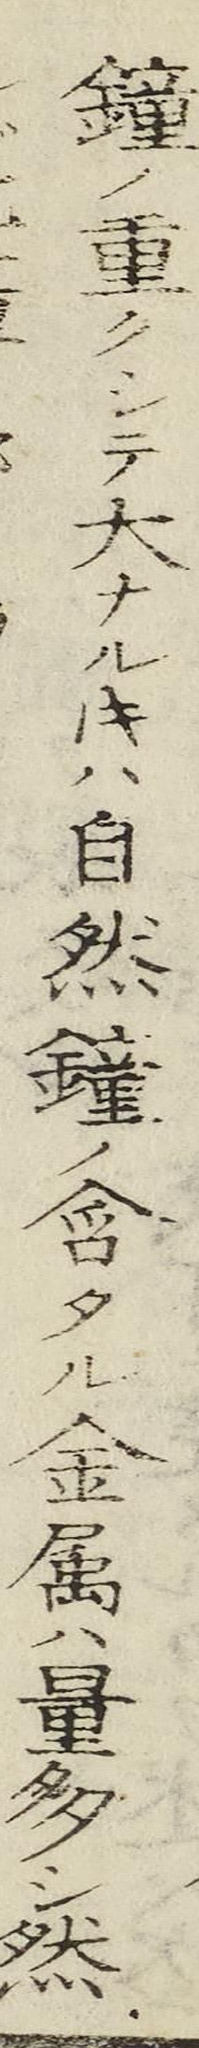鐘ノ重クシテ大ナルトキハ自然鐘ノ含タル金属ハ量多シ然
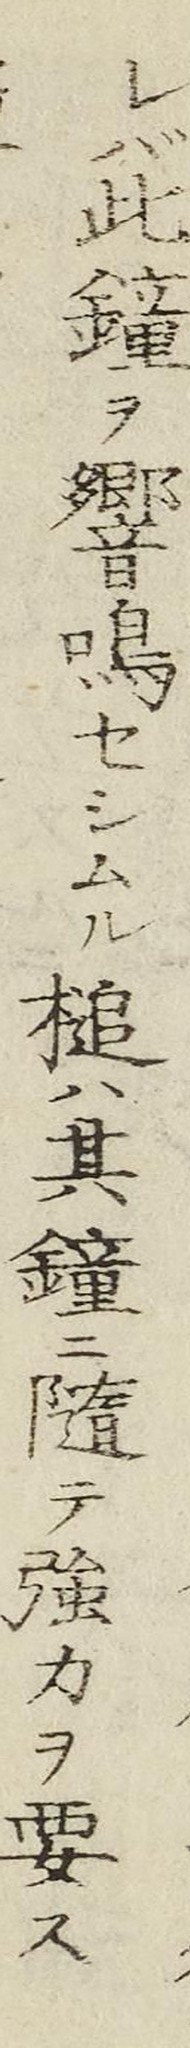レバ此鐘ヲ響鳴セシムル槌ハ其鐘ニ随テ強カヲ要ス
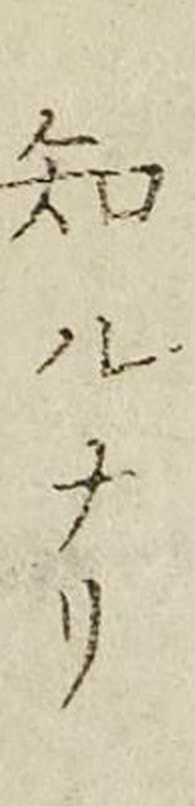知ルナリ
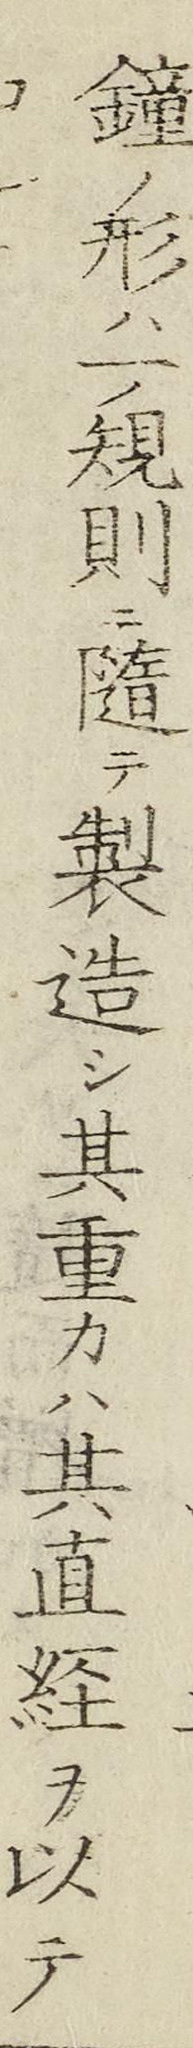鐘ノ形ハ一ノ規則ニ随テ製造シ其重力ハ其直径ヲ以テ
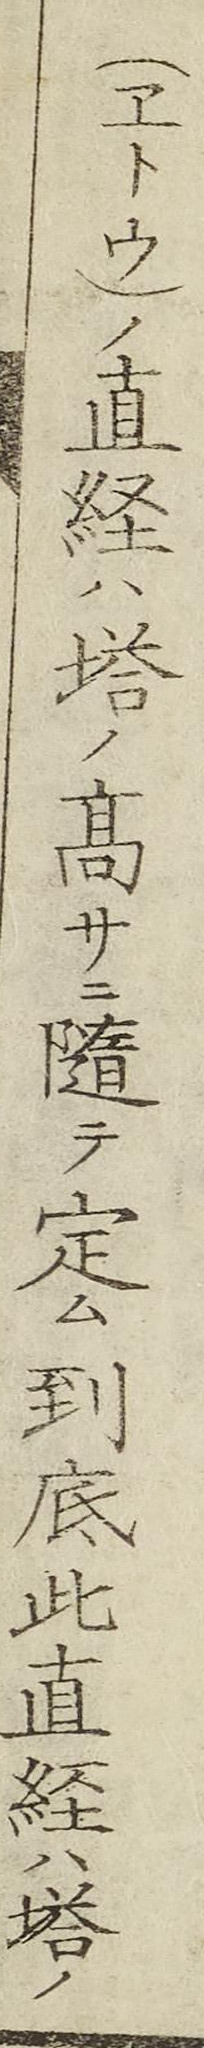ノ直径ハ塔ノ高サニ随テ定ム到底此経ハ塔ノ

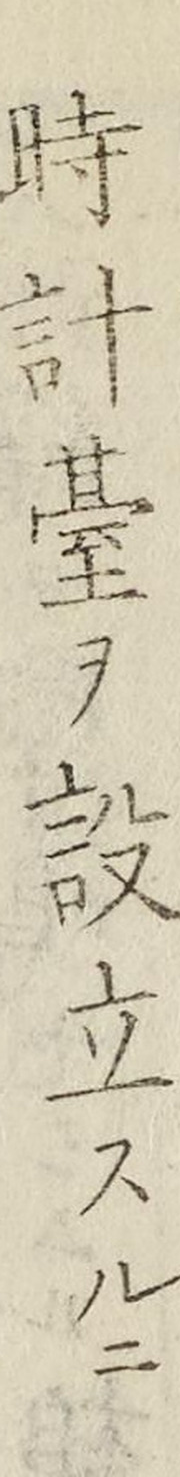時計台ヲ設立スルニ
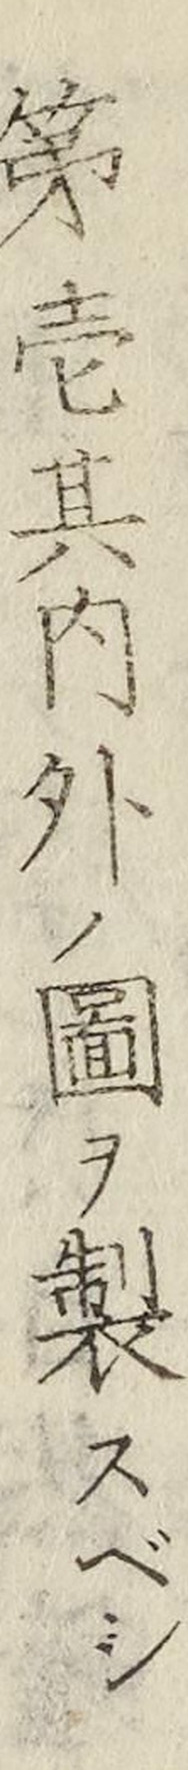第壱其内外ノ図ヲ製スベシ
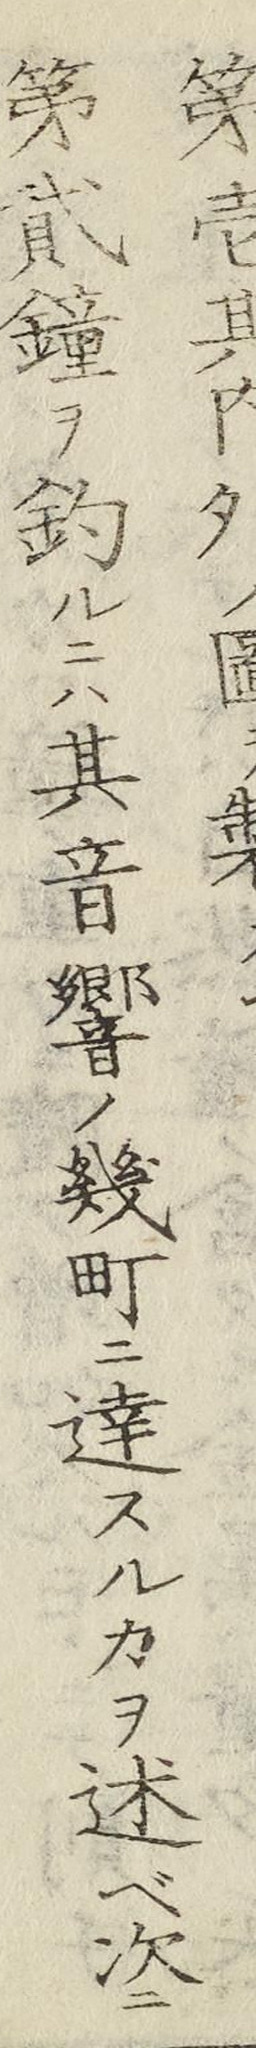第貳鐘ヲ釣ルニハ其音響ノ幾町ニ達スルカヲ述ベ次ニ
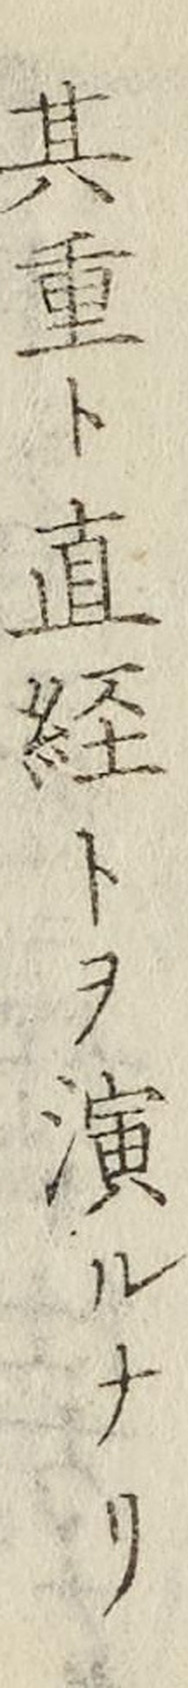其重ト直径トヲ演ルナリ
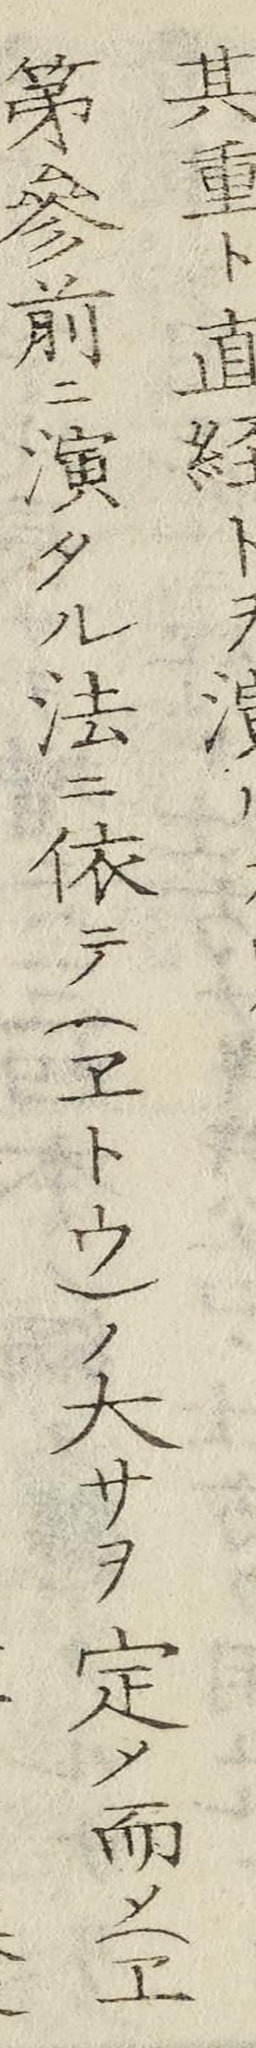第参前ニ演タル法ニ依テノ大サヲ定メ而シテ（ヱ
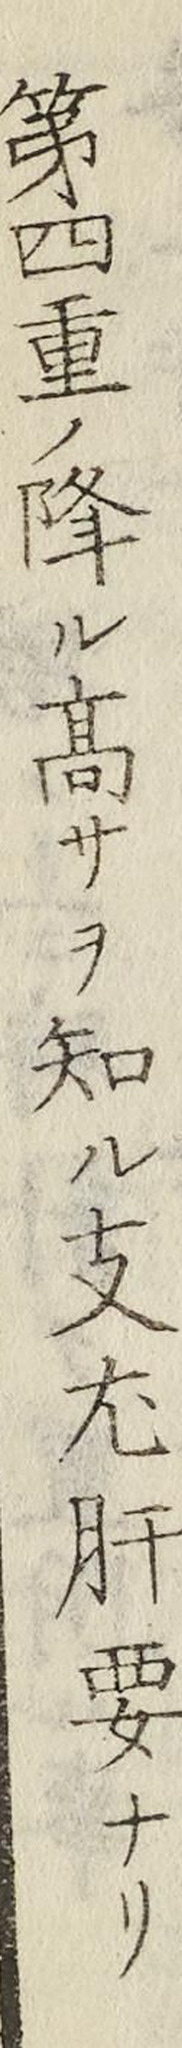第四重ノ降ル高サヲ知ル事尤肝要ナリ
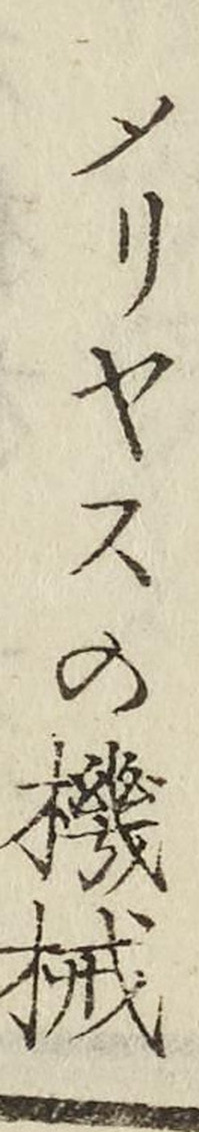メリヤスの機械
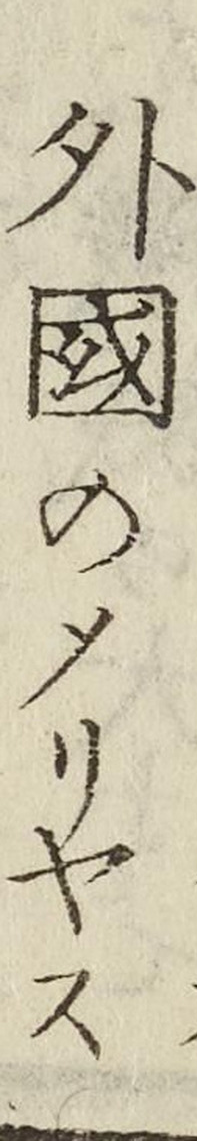外国のメリヤス
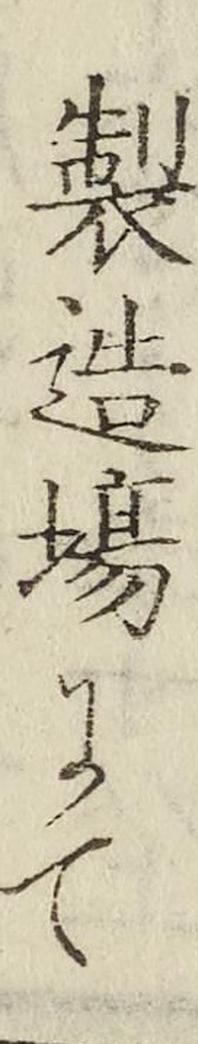製造場にて
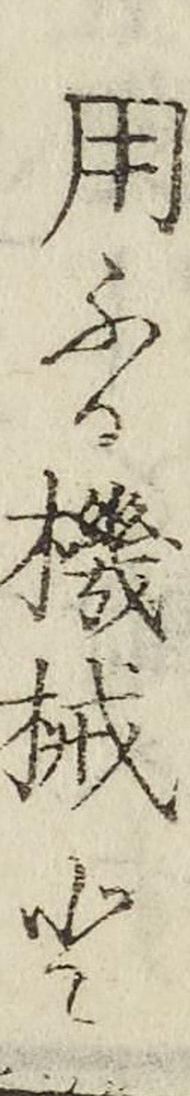用ふる機械と
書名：[時計に関する冊子]
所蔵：東京大学地震研究所図書室 Earthquake Research Institute Library, The University of Tokyo, JAPAN
